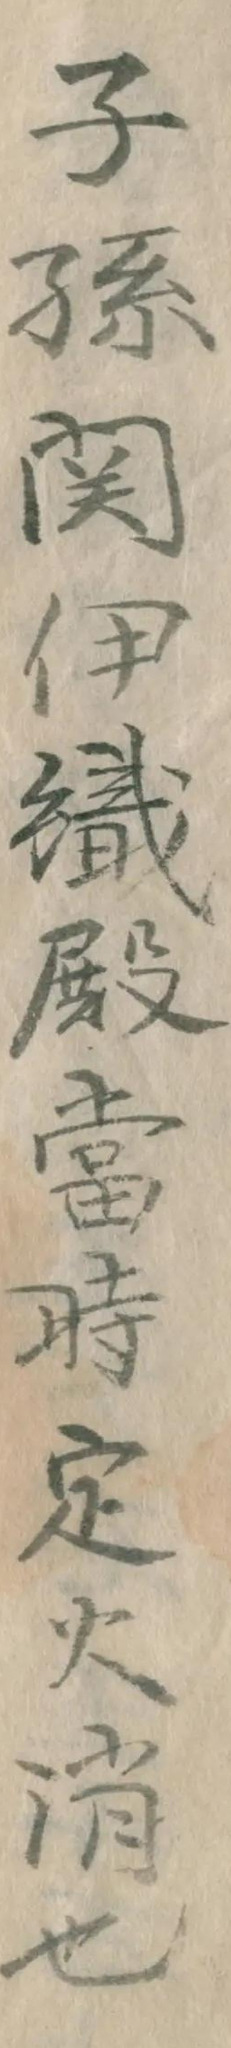子孫関伊織殿当時定火消也
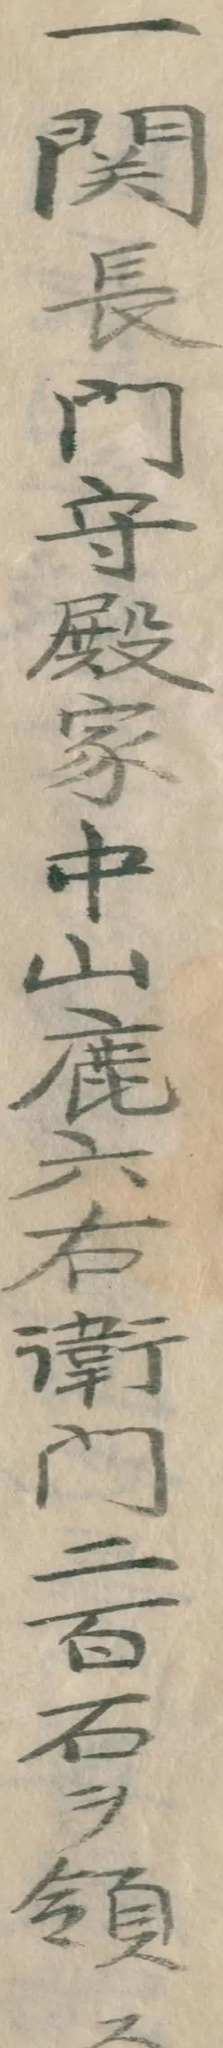一関長門守殿家中山鹿六右衛門二百石ヲ領ス
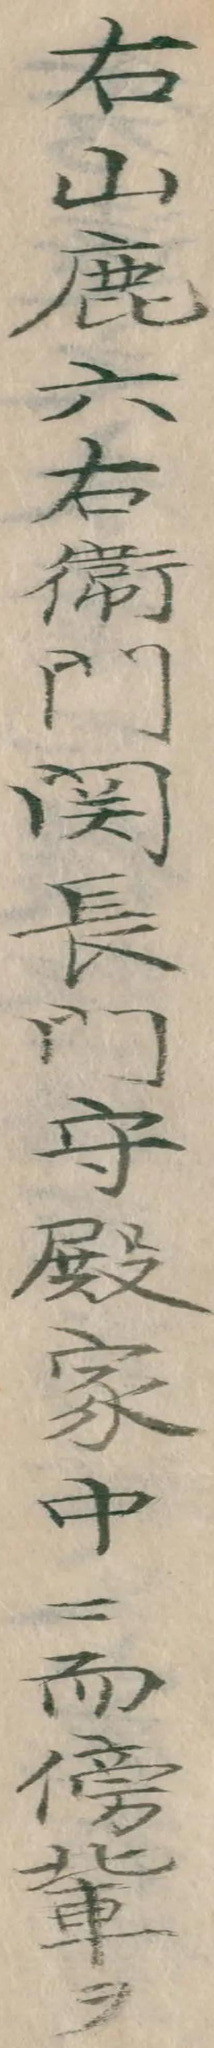右山鹿六右衞門関長門守殿家中ニテ傍輩ヲ
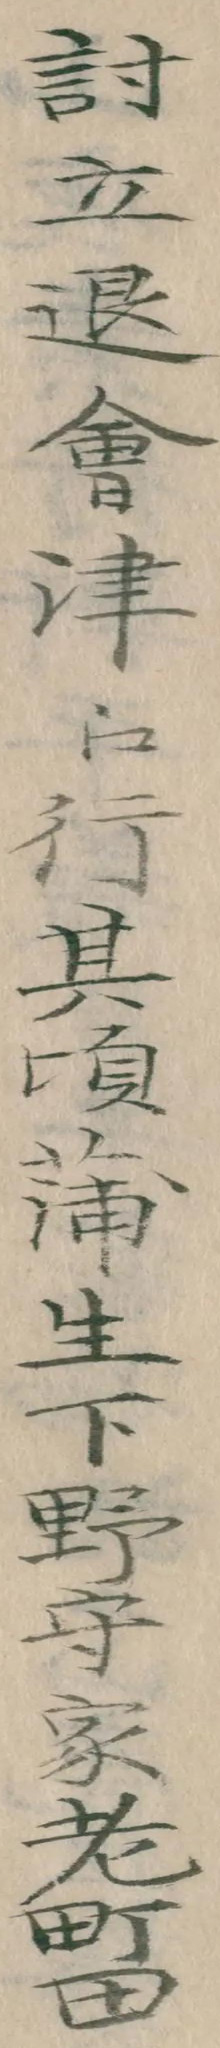討立退会津エ行其頃蒲生下野守家老町田
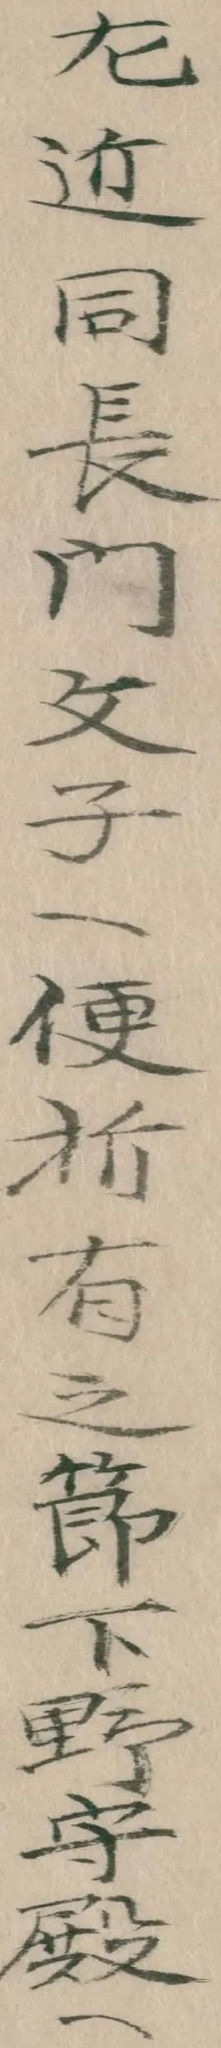左近同長門父子ヘ便折有之節下野守殿へ
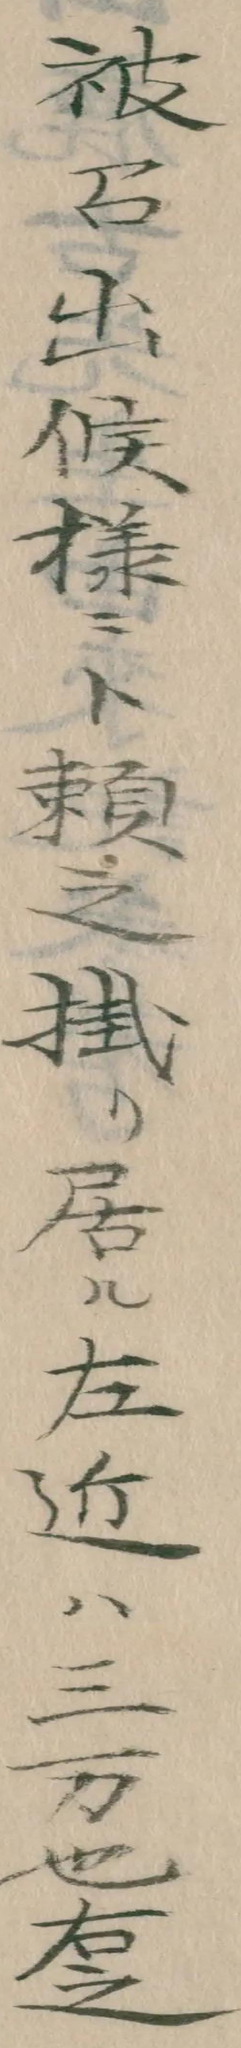被召出候様ニト頼之掛リ居ル左近ハ三万也右之
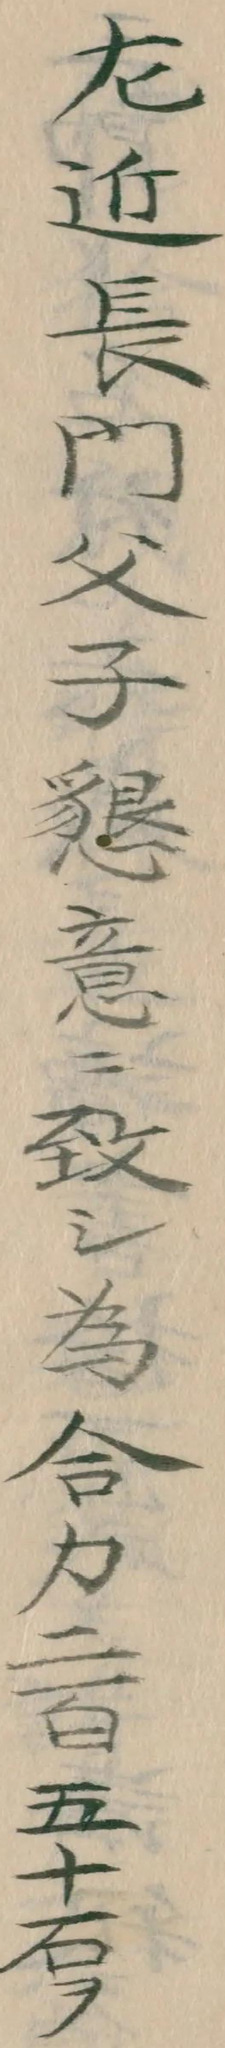左近長門父子懇意ニ致シ為合力二百五十石ヲ
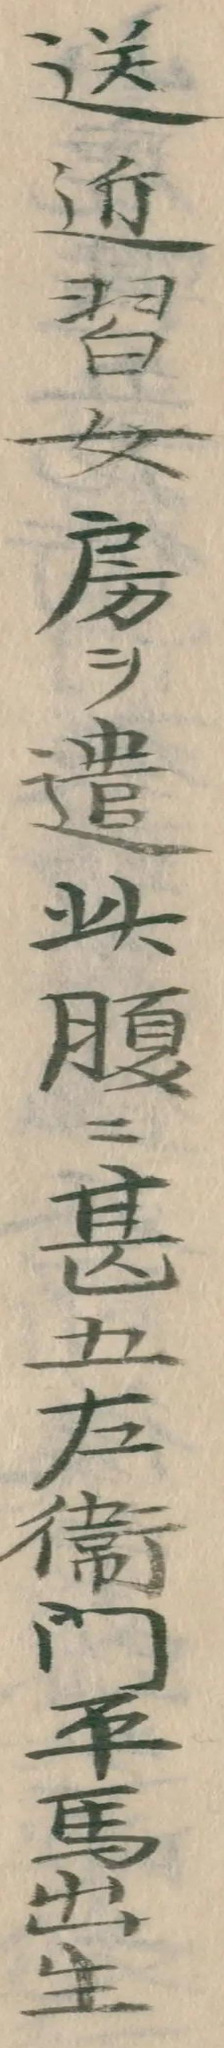送近習女房ヲ遣此腹ニ甚五左衞門平馬出生
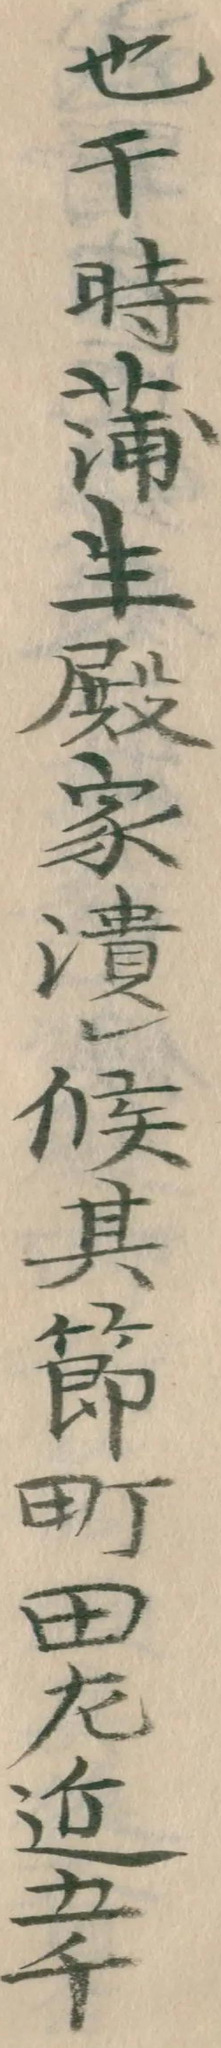也于時蒲生殿家潰レ候其節町田左近五千
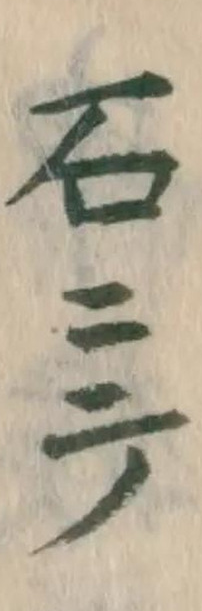石ニテ
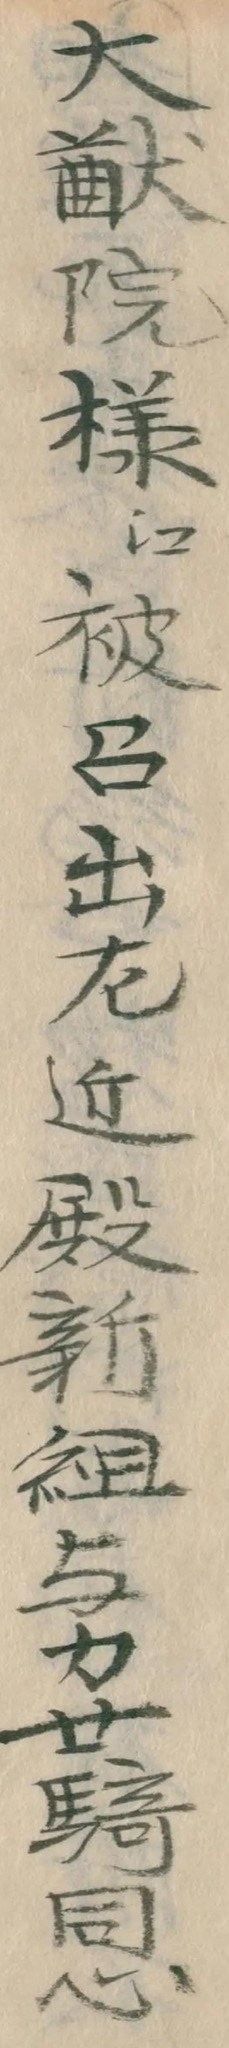大猷院様エ被召出左近殿新組与力廿騎同心
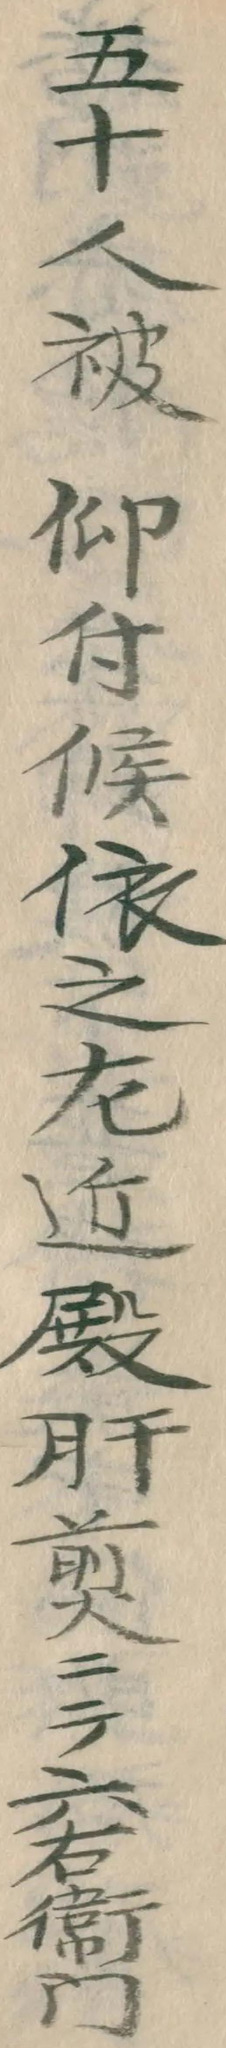五十人被仰付候依之左近殿肝煎ニテ六右衞門
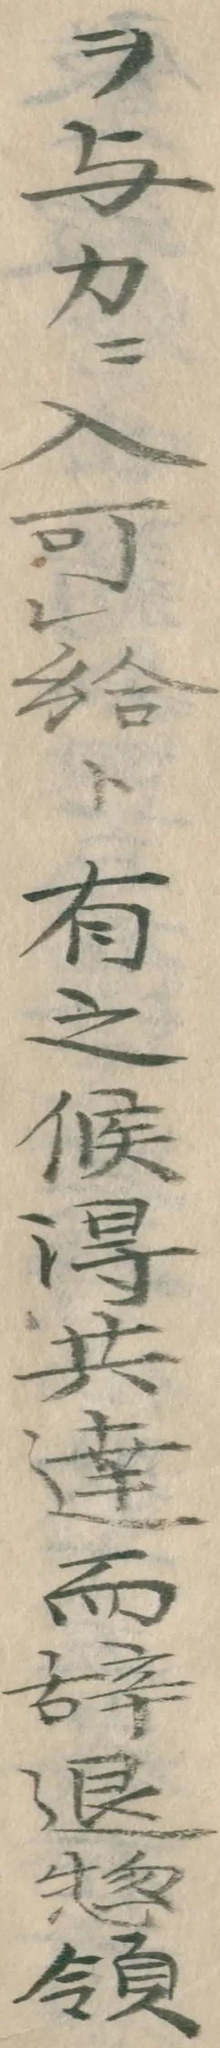ヲ与力ニ入可給ト有之候得共達テ辞退惣領
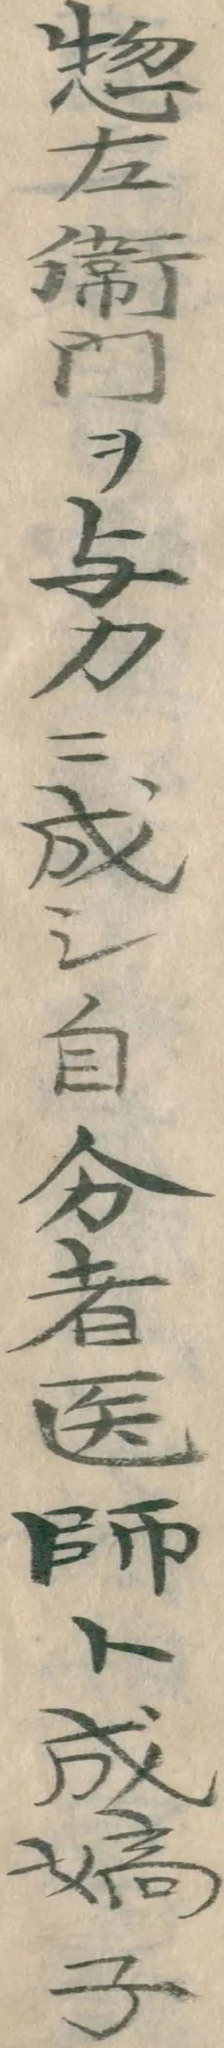惣左衞門ヲ与力ニ成シ自分ハ医師ト成嫡子
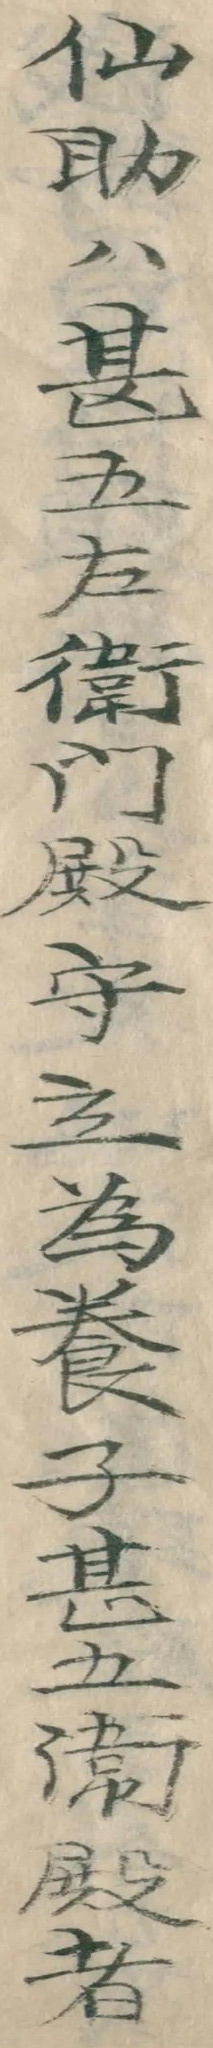仙助ハ甚五左衞門殿守立為養子甚五衞殿ハ

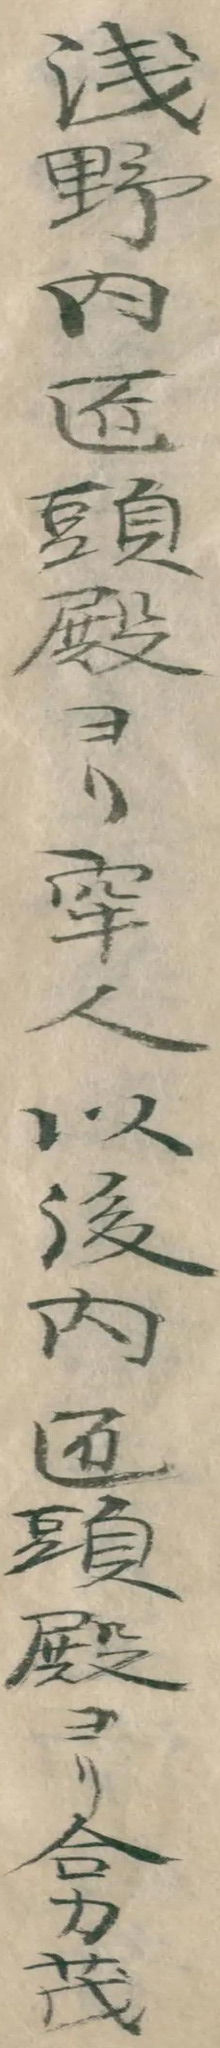浅野内匠頭ヨリ牢人以後内匠頭殿ヨリ合力モ
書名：輪池叢書. 12
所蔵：国立国会図書館 National Diet Library, JAPAN
